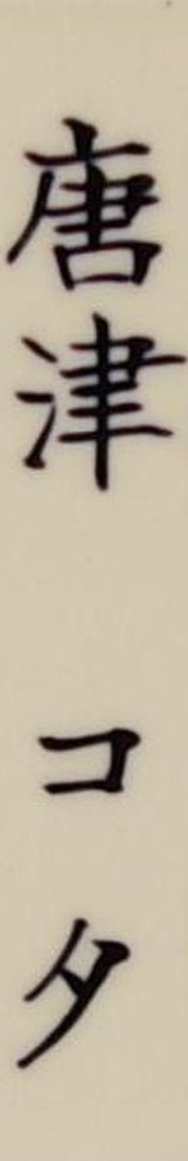唐津コタ
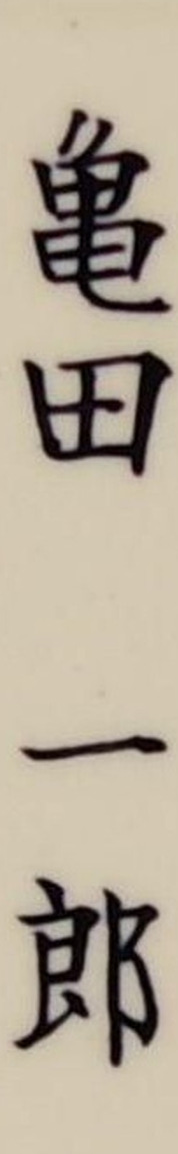亀田一郎
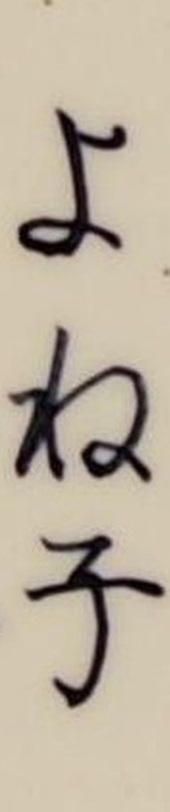よね子
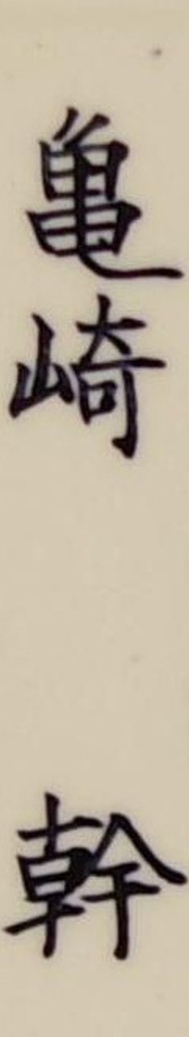亀崎幹
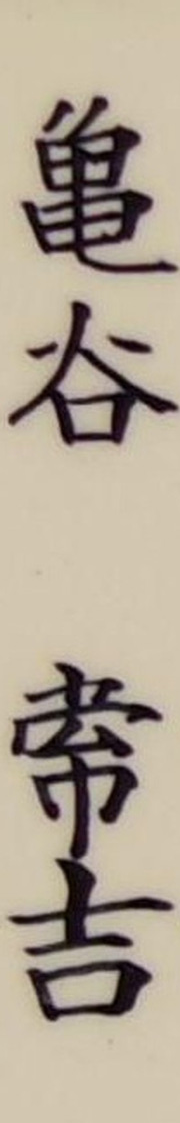亀谷常吉
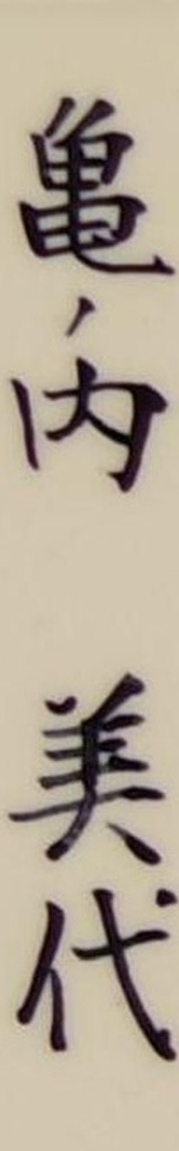亀ノ内美代
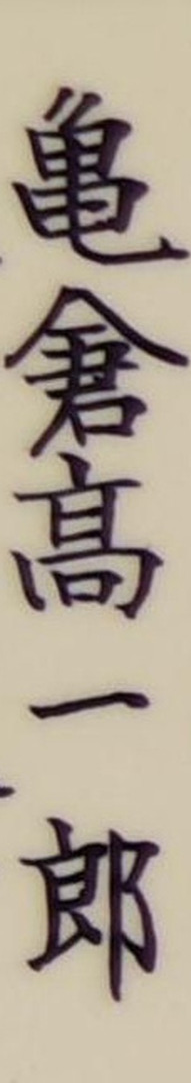亀倉高一郎
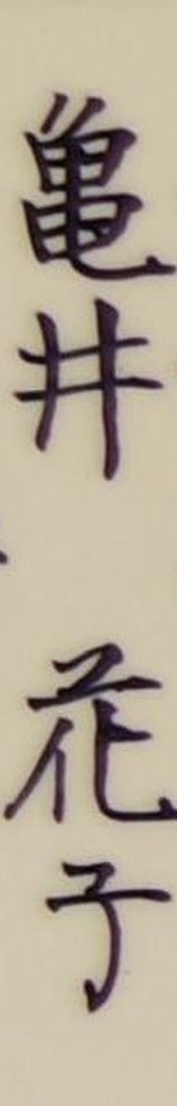亀井花子
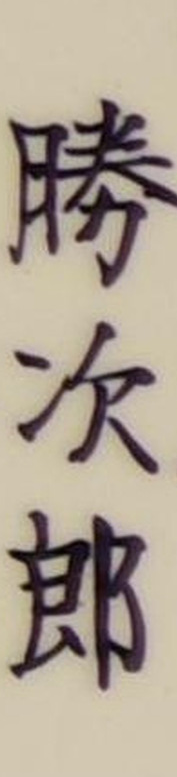勝次郎
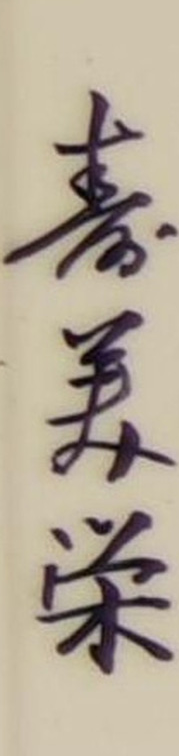寿美栄

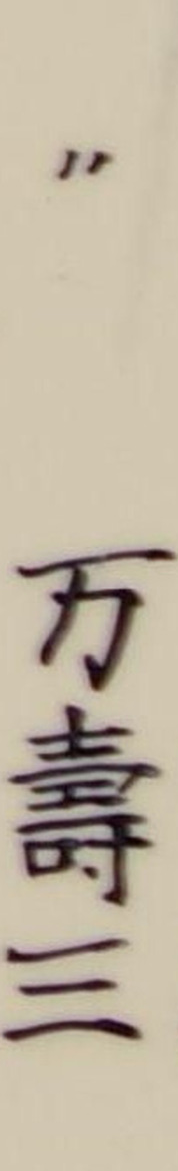万壽三
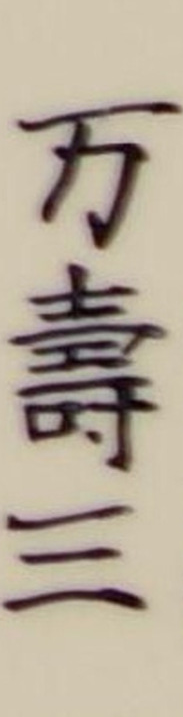万壽三
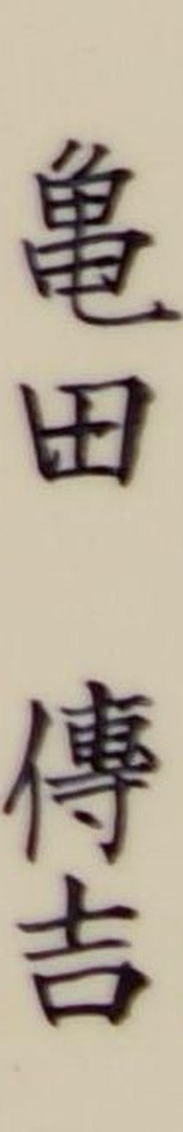亀田傳吉
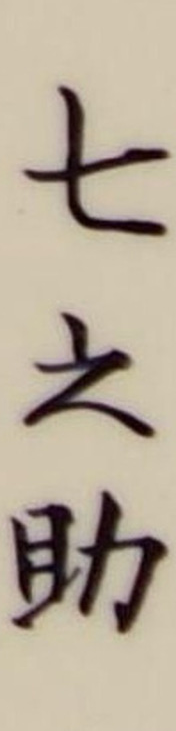七之助
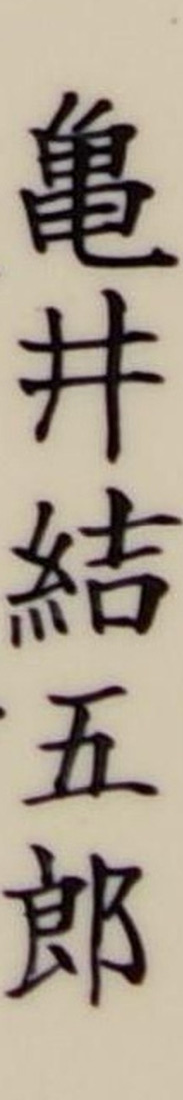亀井結五郎
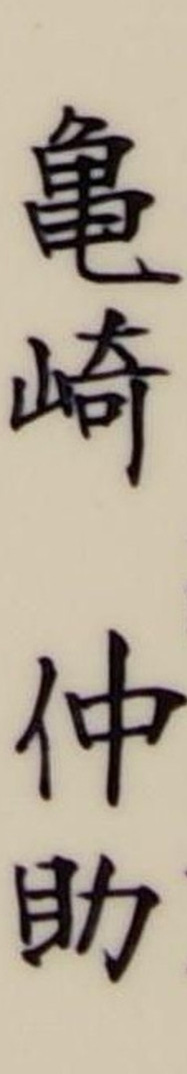亀崎仲助
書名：E~L
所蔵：高野山金剛峯寺
